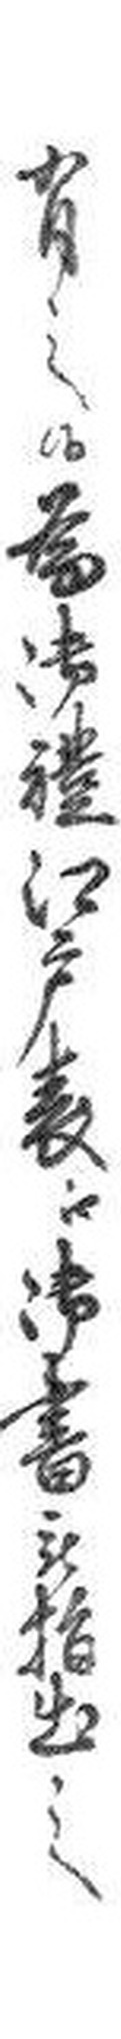有之候為御礼江戸表江御書被指出之
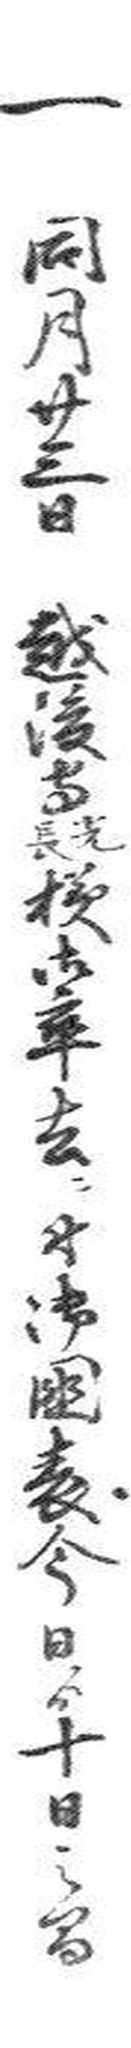一同月廿三日越後守光長様御卒去ニ付御国表今日ゟ十日之間
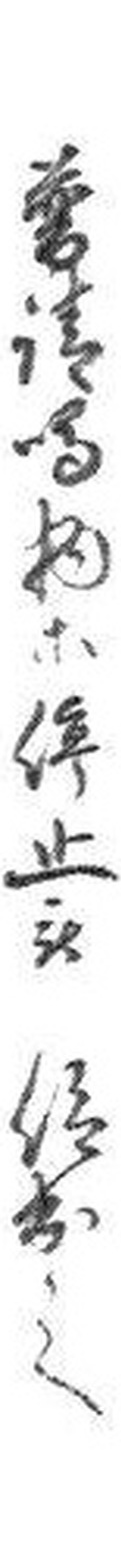普請鳴物等停止被仰出之
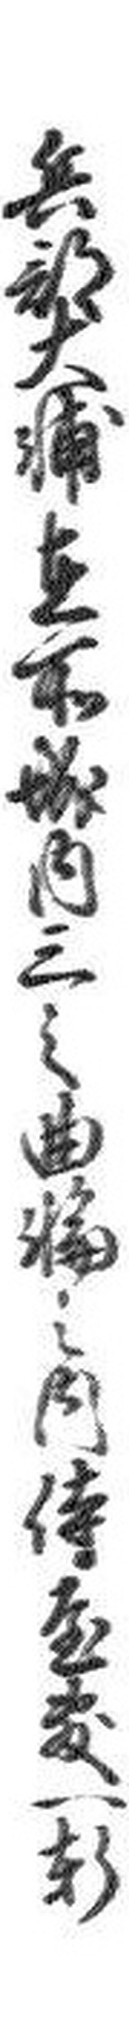兵部大輔在所城内三之曲輪之内侍屋敷一軒
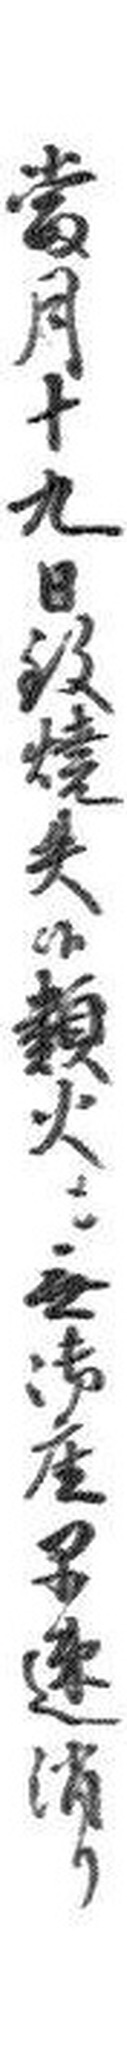当月十九日致焼失候類火も無御座早速消リ
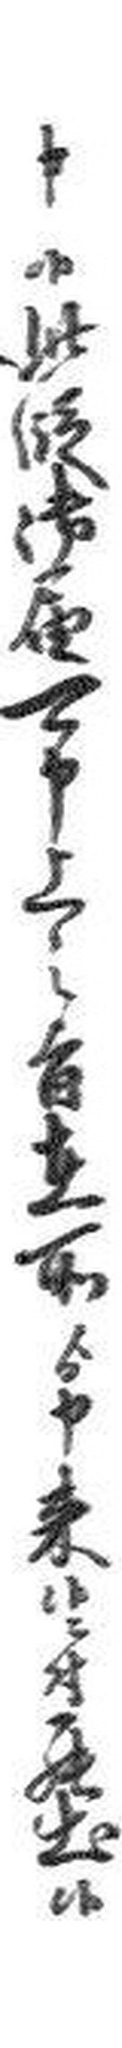申候此段御届可申上之旨在所ゟ申来候ニ付罷出候
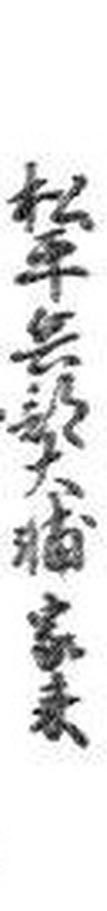松平兵部大輔家来
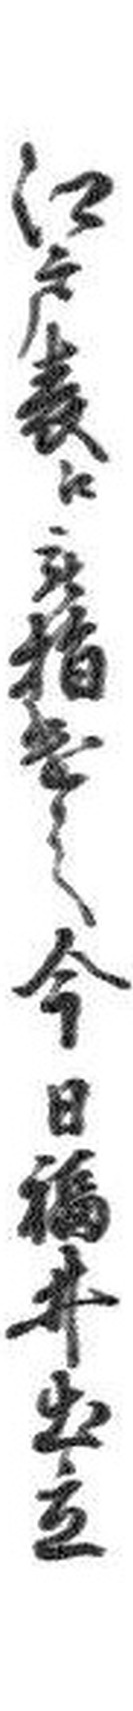江戸表江被指遣之今日福井出立

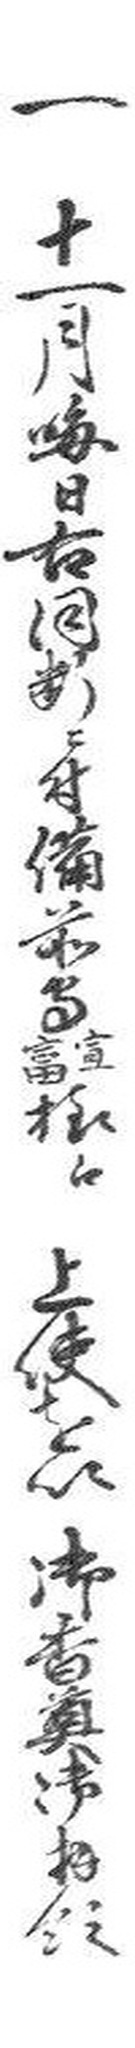一十一月晦日右同断ニ付備前守宣富様江上使を以御香奠御拝領
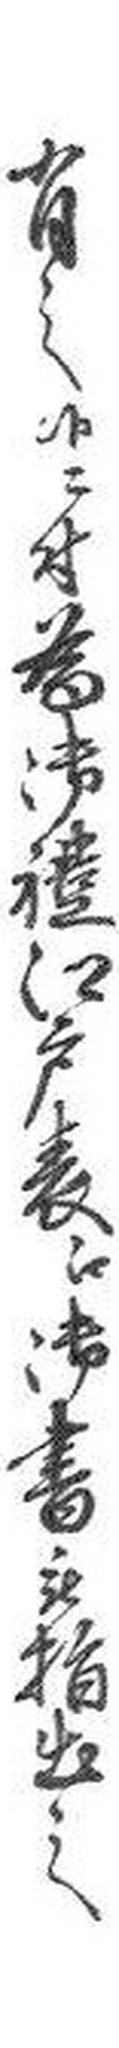有之候ニ付為御礼江戸表江御書被指出之
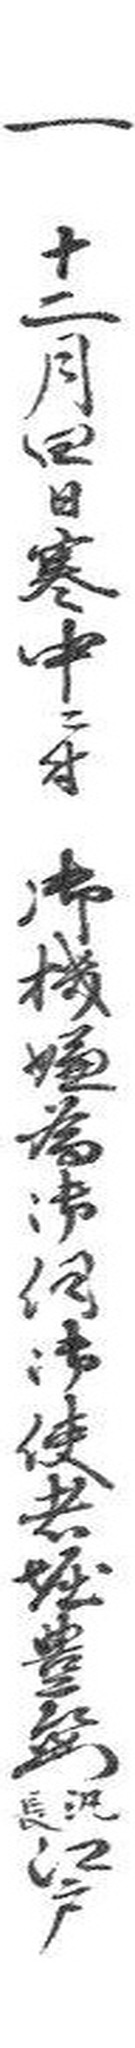一十二月四日寒中ニ付御機嫌為御伺御使者堀豊左衛門汎長江戸
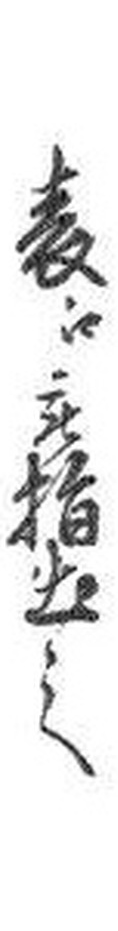表江被指出之
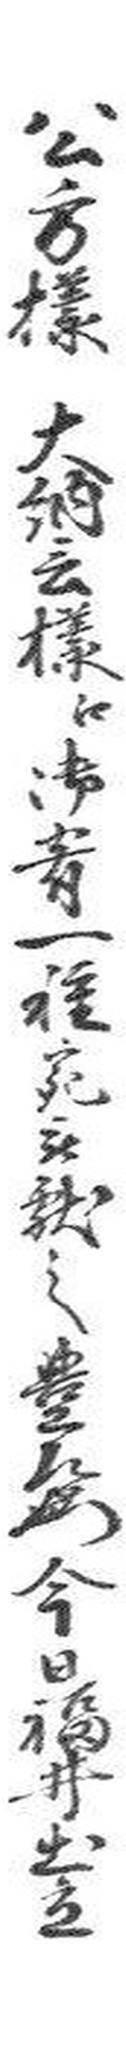公方様大納言様江御肴一種宛被献之豊左衛門今日福井出立
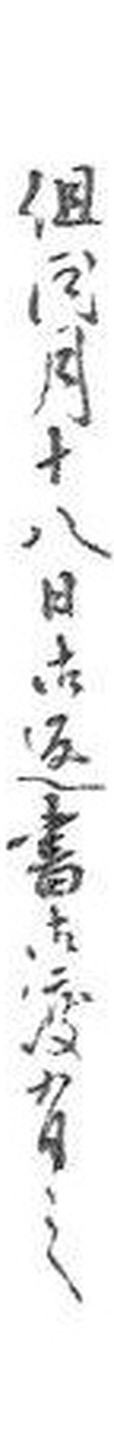但同月十八日御返書御渡有之
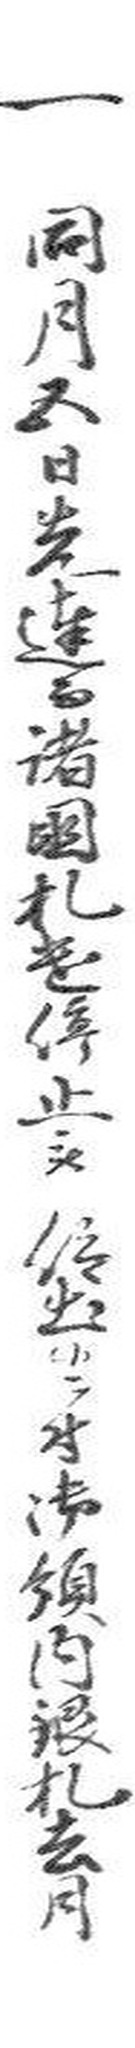一同月五日先達而諸国札遣停止被仰出候ニ付御領内銀札去月
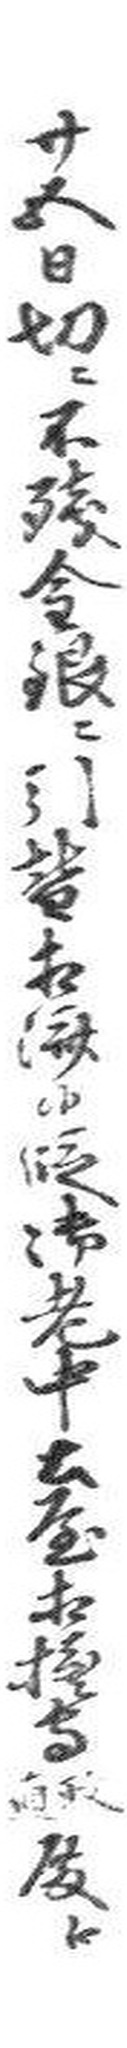廿五日切ニ不残金銀ニ引替相済候段御老中土屋相模守政直殿江
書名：家譜 二十四 吉品公 従宝永三年到同五年
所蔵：福井県文書館 Fukui Prefectural Archives
